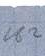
den
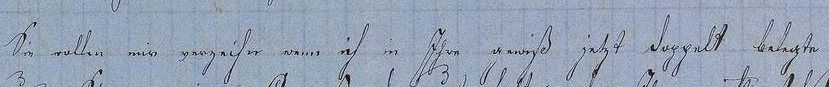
Sie wollen mir verzeihen wenn ich in Ihre gewiß jetzt doppelt belegte
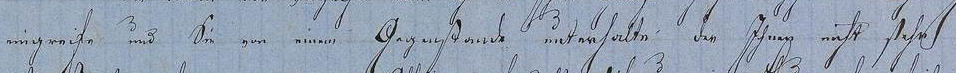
eingreife und Sie von einem Gegenstande unterhalte der Ihnen nicht sehr
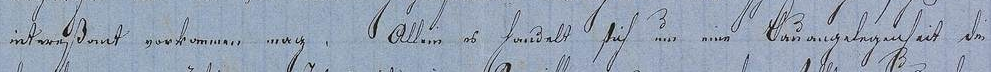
intereßant vorkommen mag. Allein es handelt sich um eine Bauangelegenheit die
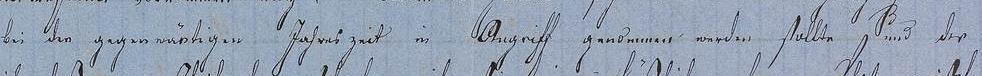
bei der gegenwärtigen Jahreszeit in Angriff genommen werden sollte und der
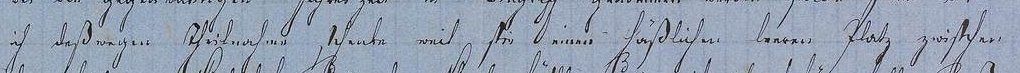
ich deßwegen Theilnahme schenke weil sie einen häßlichen leeren Platz zwischen
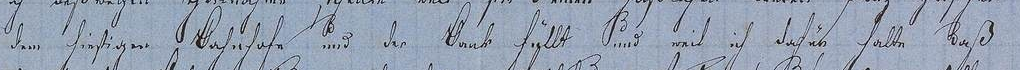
dem hiesigen Bahnhofe und der Bank füllt und weil ich dafür halte daß
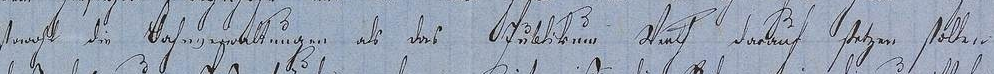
sowohl die Bahnverwaltungen als das Publikum Werth darauf setzen sollen
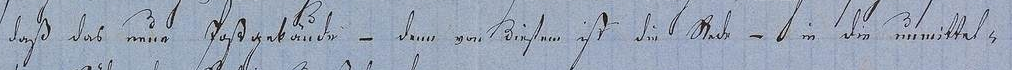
daß das neue Postgebäude – denn von diesem ist die Rede – in die unmittel-
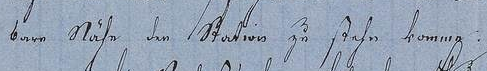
bare Nähe der Station zu stehen komme.
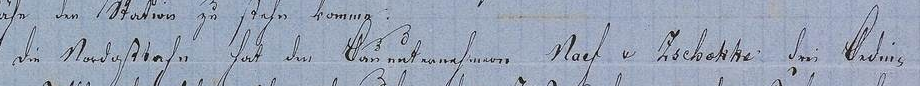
Die Nordostbahn hat den Bauunternehmern Naef & Zschokke drei Bedin-
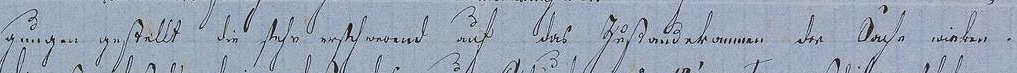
gungen gestellt die sehr erschwerend auf das Zustandekommen der Sache wirken.
